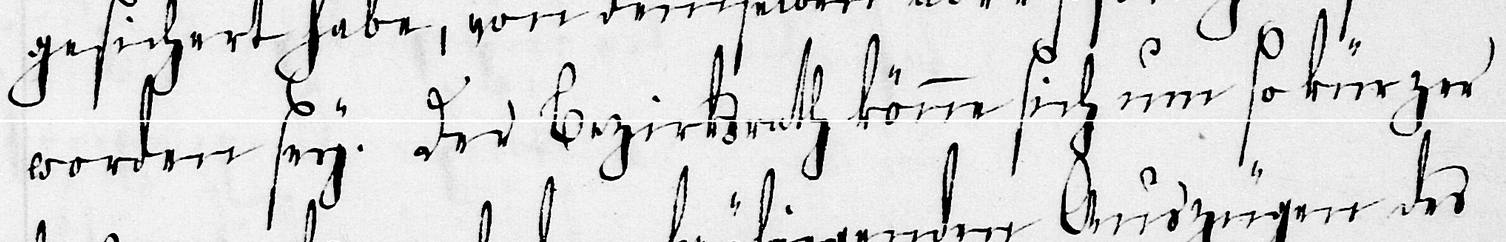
worden sey. Der Bezirksrath könne sich um so kürzer
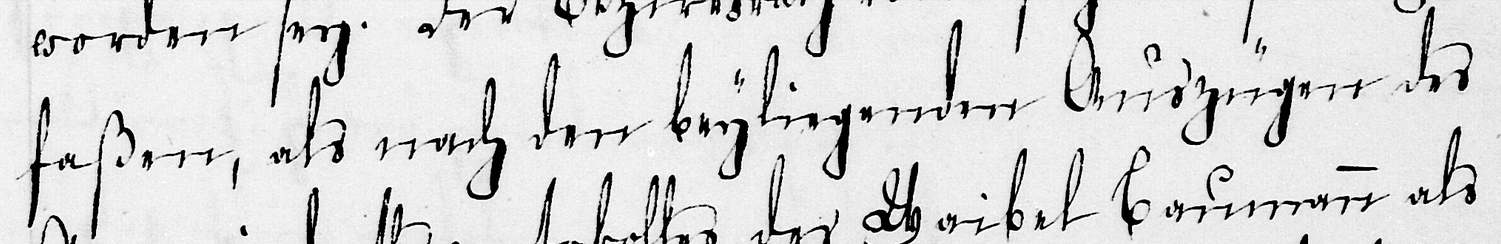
faßen, als nach den beyliegenden Auszügen des
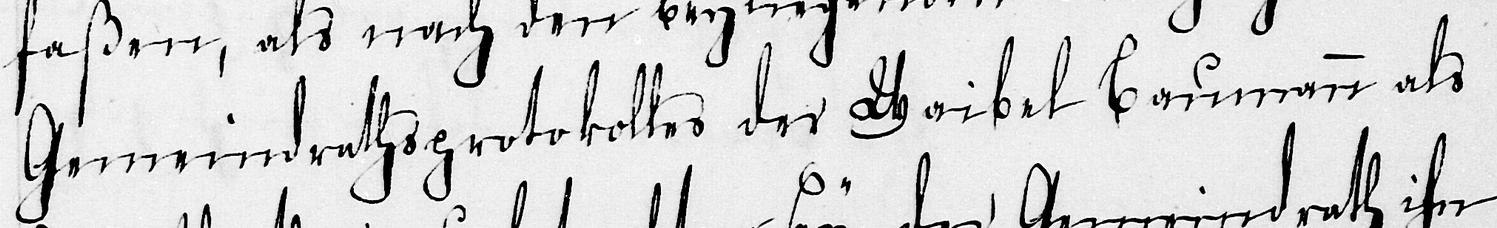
Gemeindrathsprotokolles der Waibel Baumann als
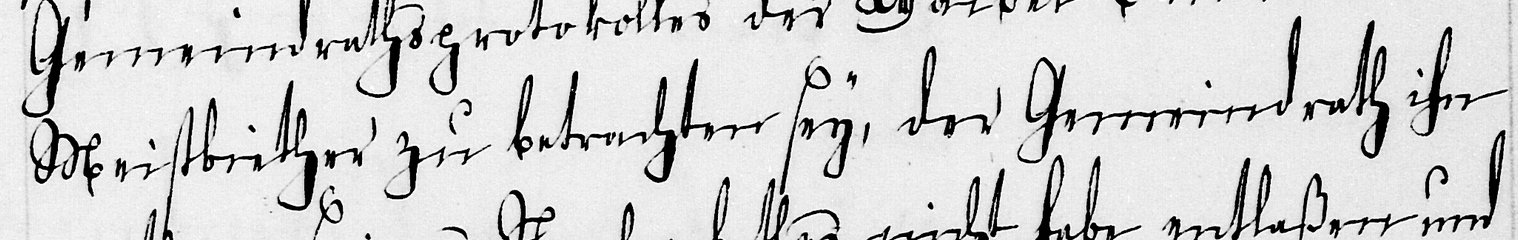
Meistbiether zu betrachten sey, der Gemeindrath ihn
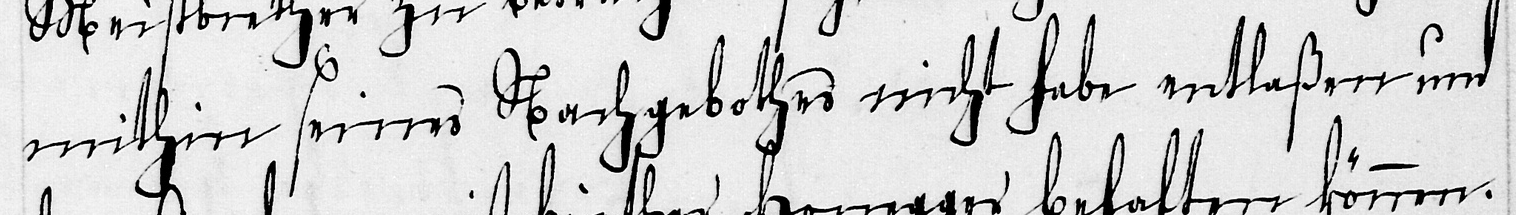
mithin seines Nachgebothes nicht habe entlaßen und
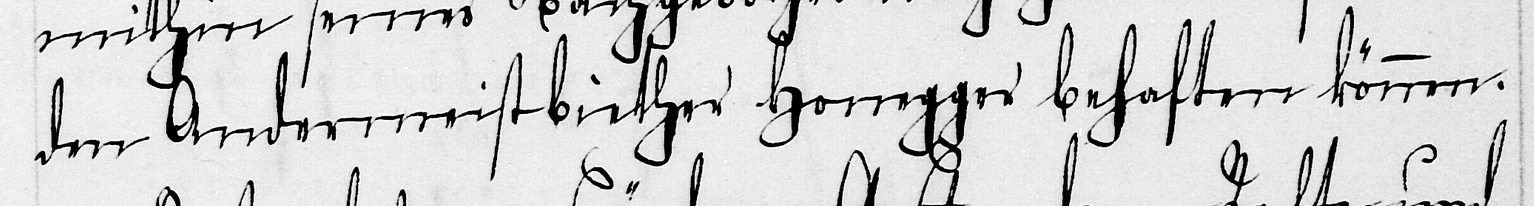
den Andermeistbiether Honegger behalten können.
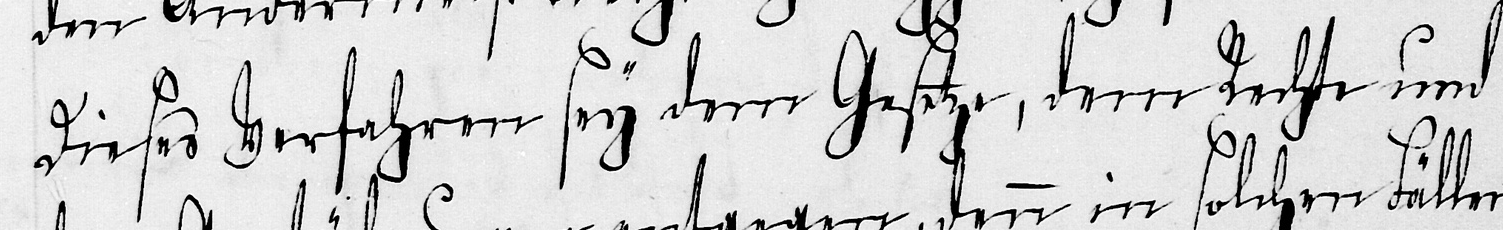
Dieses Verfahren sey dem Gesetze, dem Rechte und
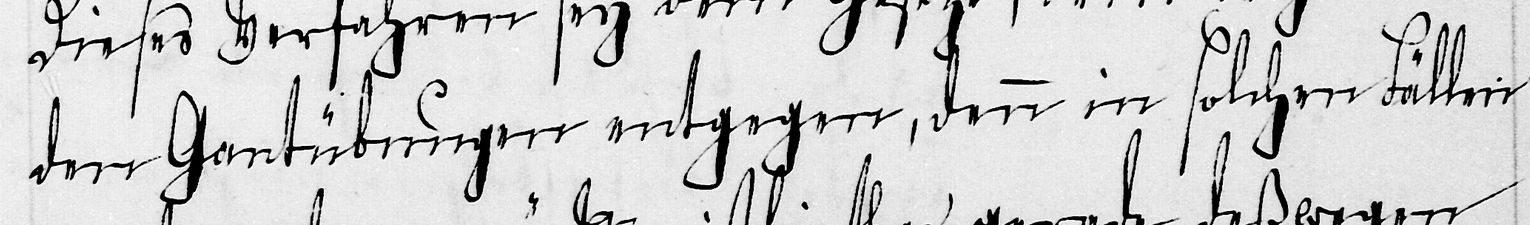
den Gantübungen entgegen, denn in solchen Fällen
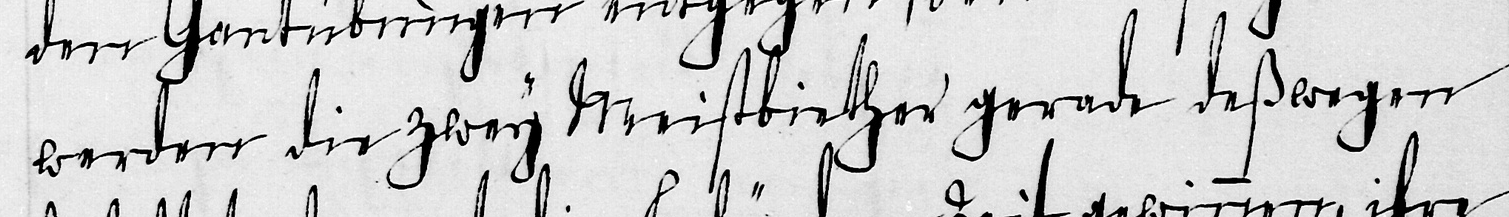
werden die zwey Meistbiether gerade deßwegen
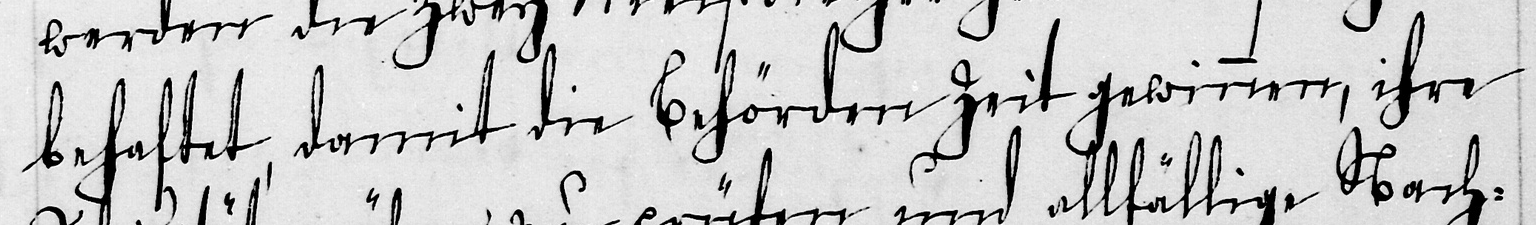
behaftet, damit die Behörden Zeit gewinnen, ihre
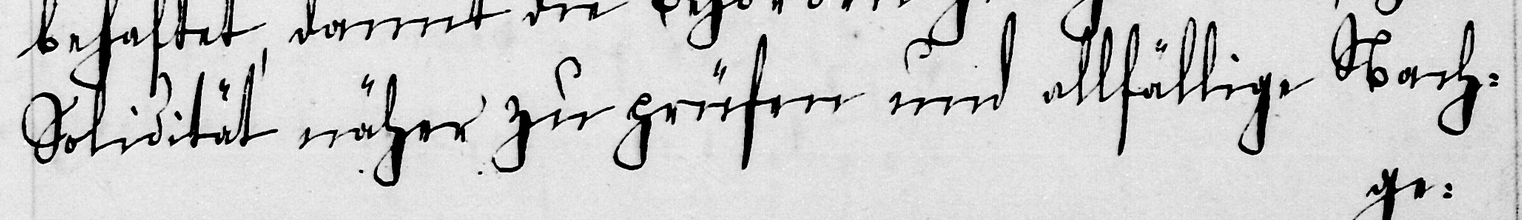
Solidität näher zu prüfen und allfällige Nach-
